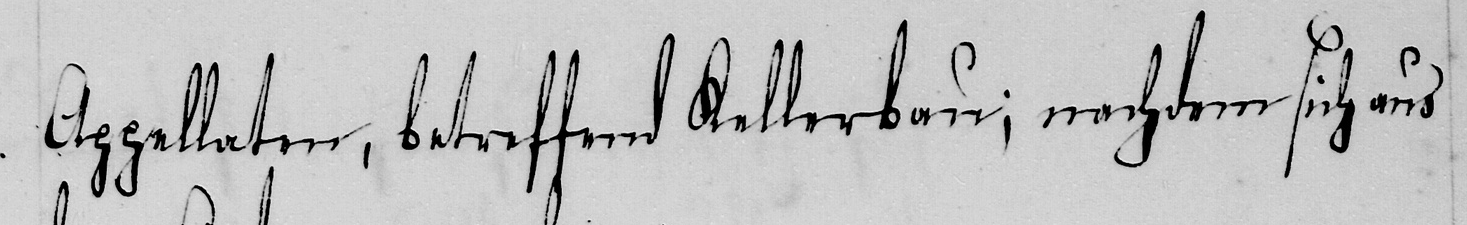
pellaten, betreffend Kellerbau; nachdem sich a¬
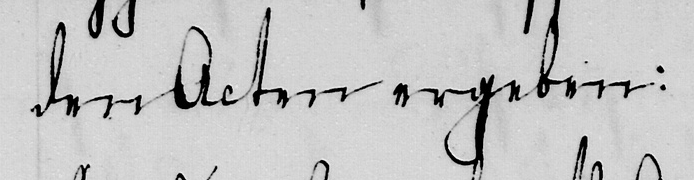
den Acten ergeben:
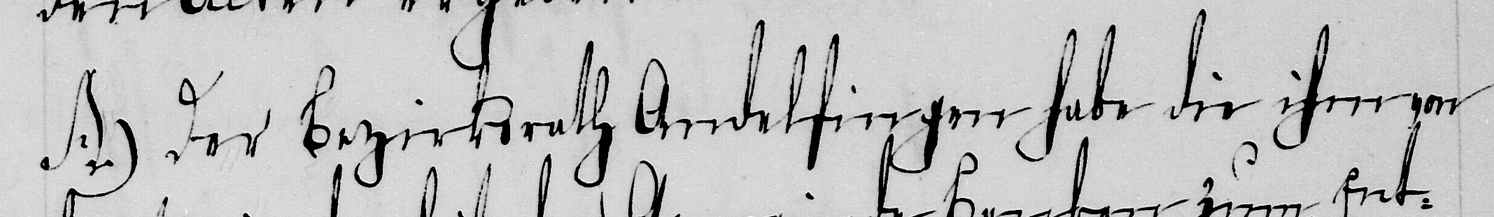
A.) Der Bezirksrath Andelfingen habe die ihm von
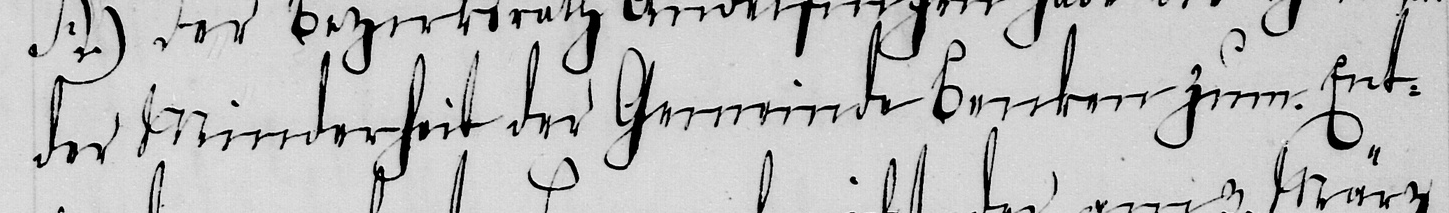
der Minderheit der Gemeinde Benken zum Ent¬
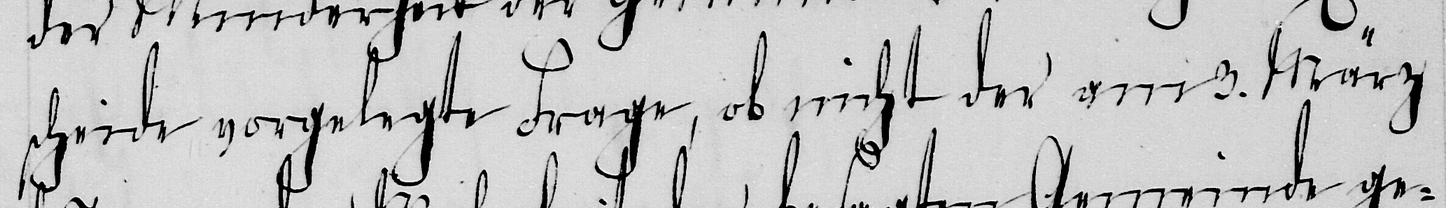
scheide vorgelegte Frage, ob nicht der am 3. März
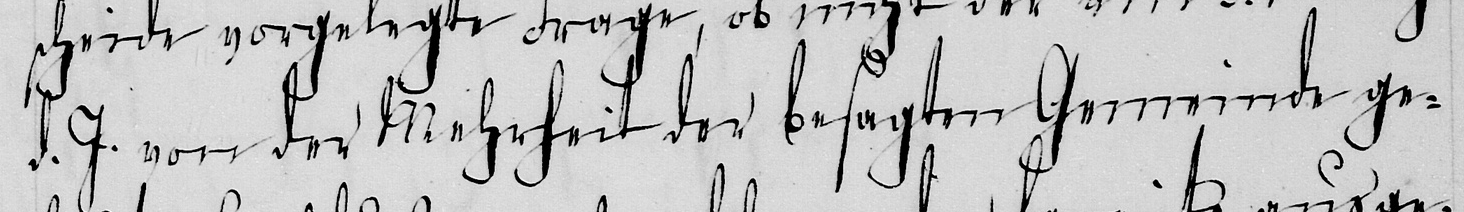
d. J. von der Mehrheit der besagten Gemeinde ge¬
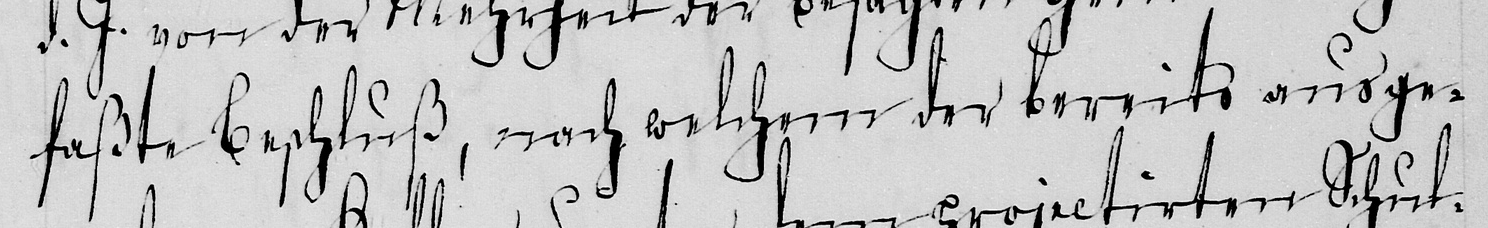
faßte Beschluß, nach welchem der bereits ausge¬
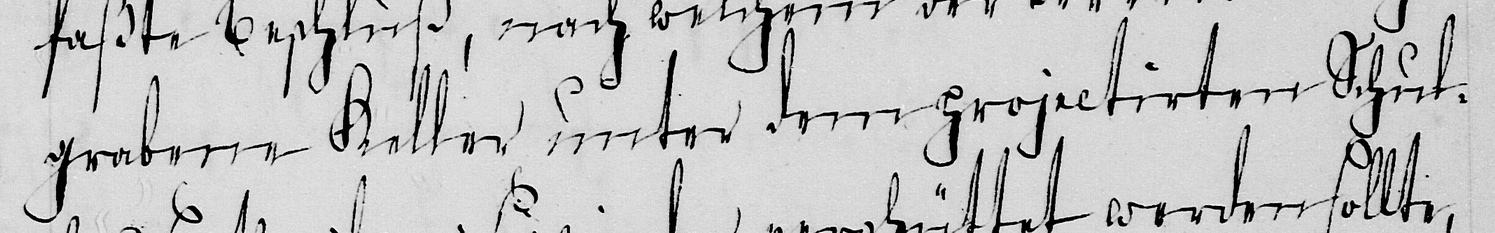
grabene Keller unter dem projectirten Schul¬
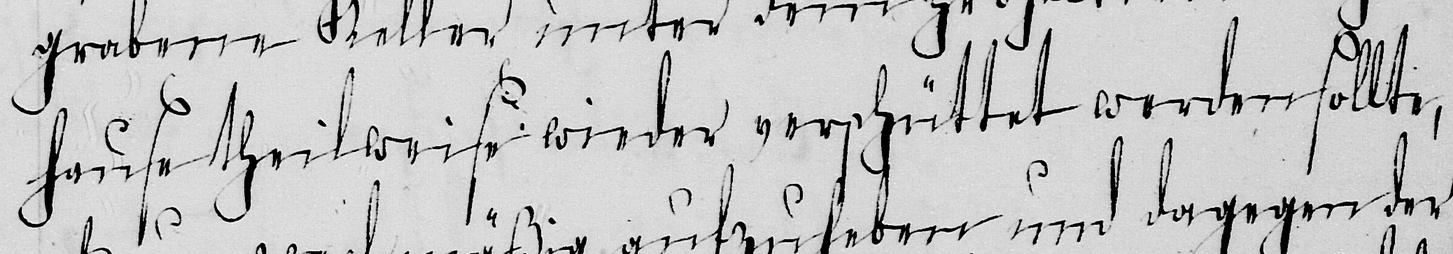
hause theilweise wieder verschüttet werden sollt¬
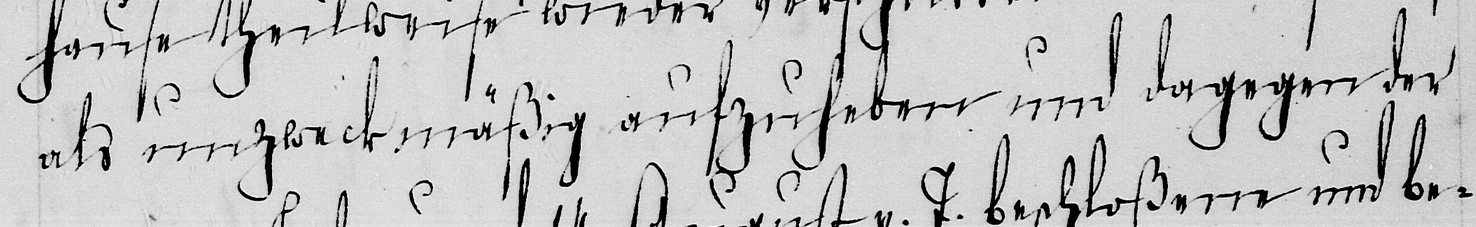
als unzweckmäßig aufzuheben und dagegen der
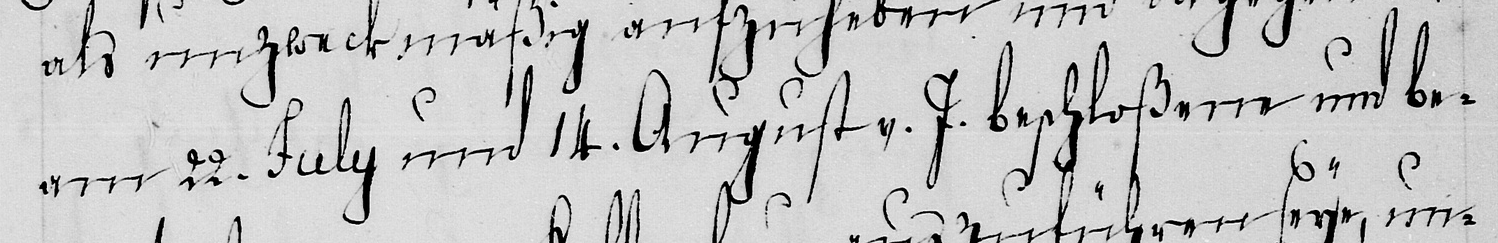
am 22. July und August v. J. beschloßene und be¬
